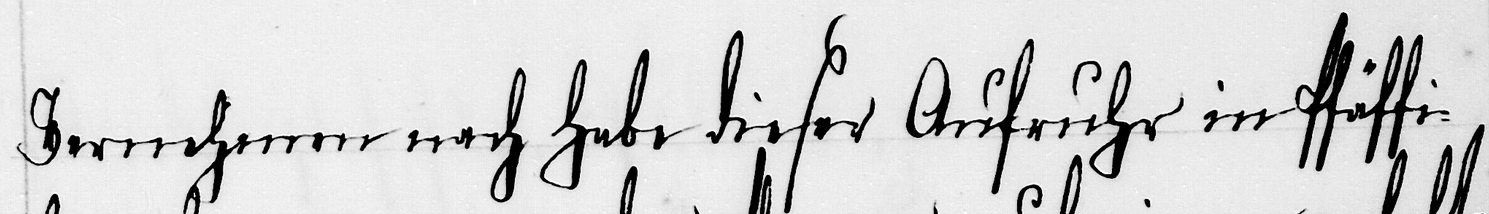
Vernehmen nach habe dieser Aufruhr in Pfäffi¬
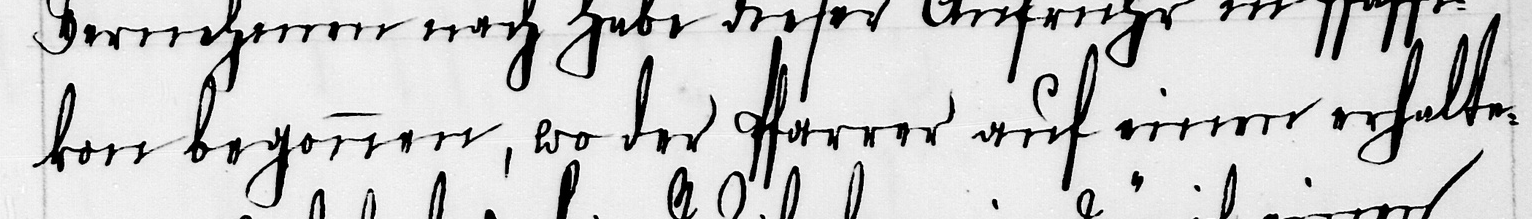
kon begonnen, wo der Pfarrer auf einen erhalte¬
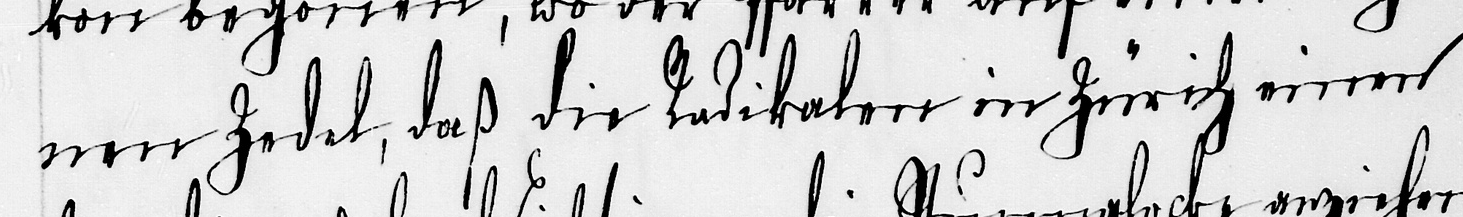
nen Zedel, daß die Radikalen in Zürich einen
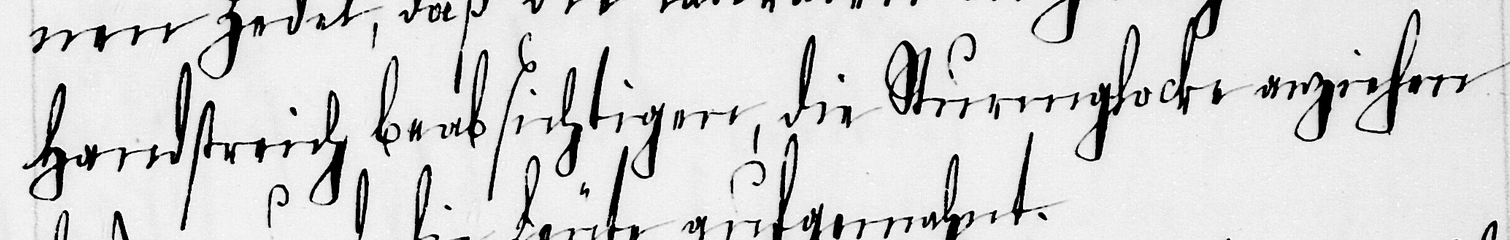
Handstreich beabsichtigen, die Sturmglocke anziehen
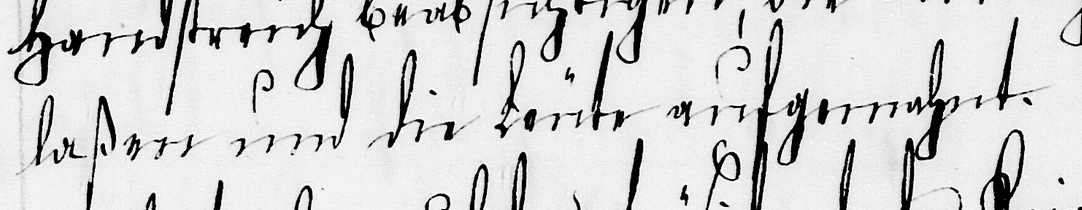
laßen und die Leute aufgemahnt.
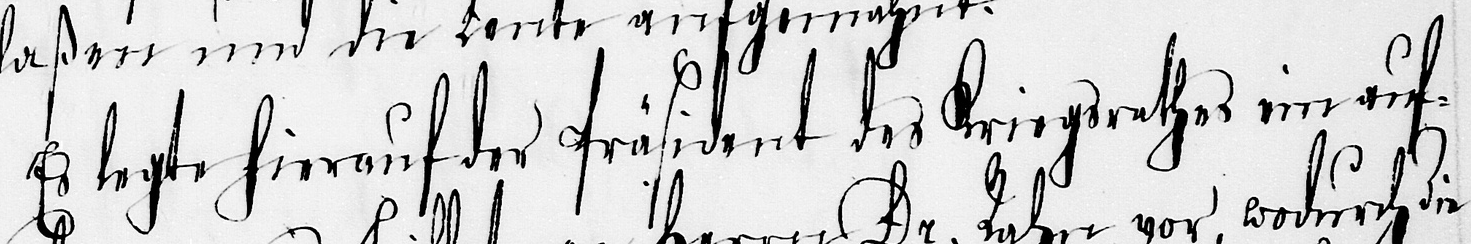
legte hierauf der Präsident des Kriegsrathes ein auf¬
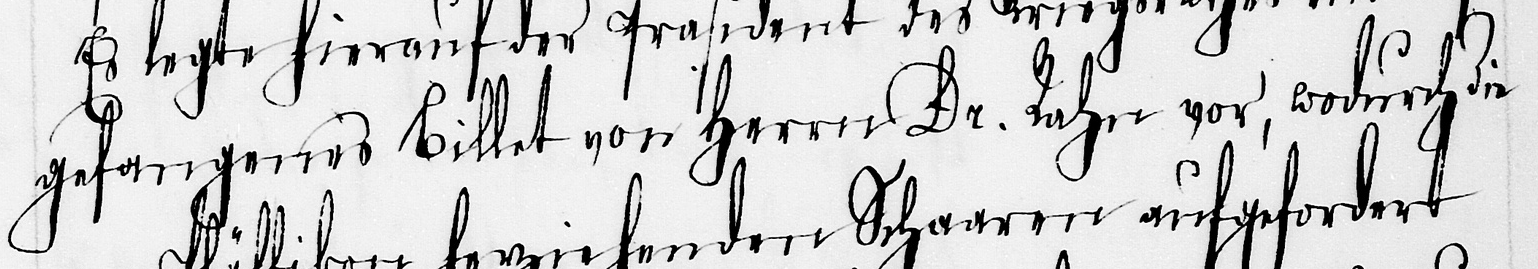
gefangenes Billet von Herrn Dr. Rahn vor, wodurch d¬
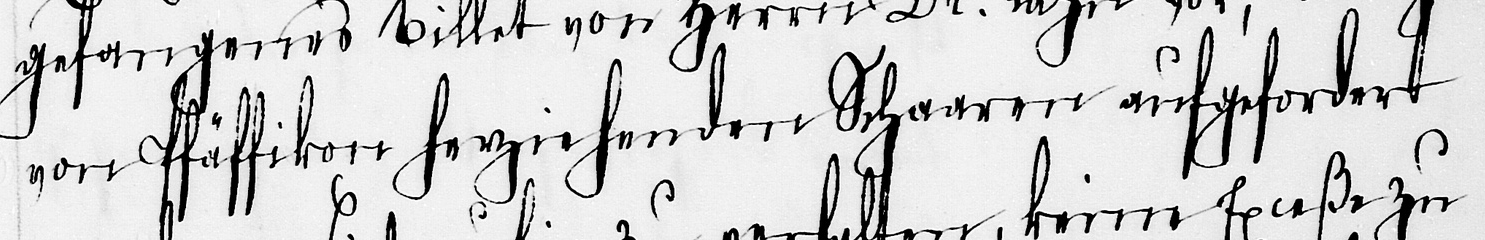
von Pfäffikon herziehenden Schaaren aufgefordert
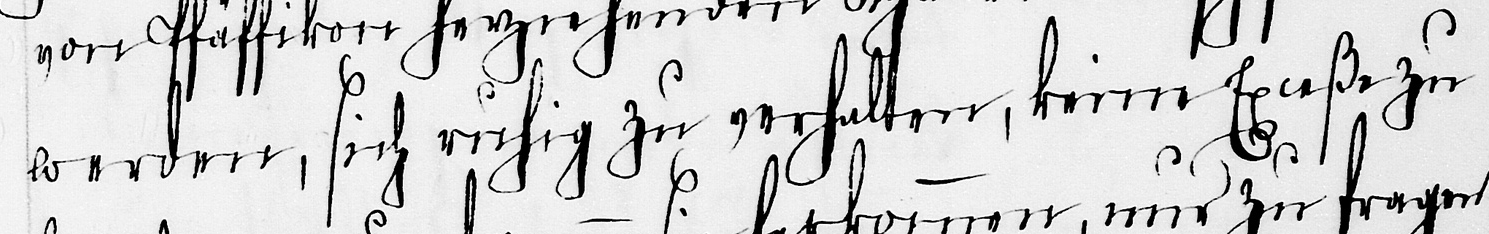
werden, sich ruhig zu verhalten, keine Exceße zu
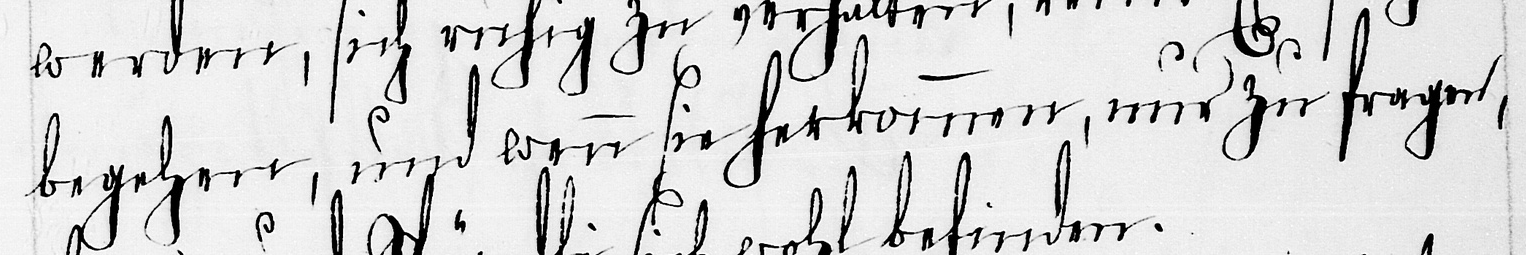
begehen, und wenn sie herkommen, nur zu fragen,
